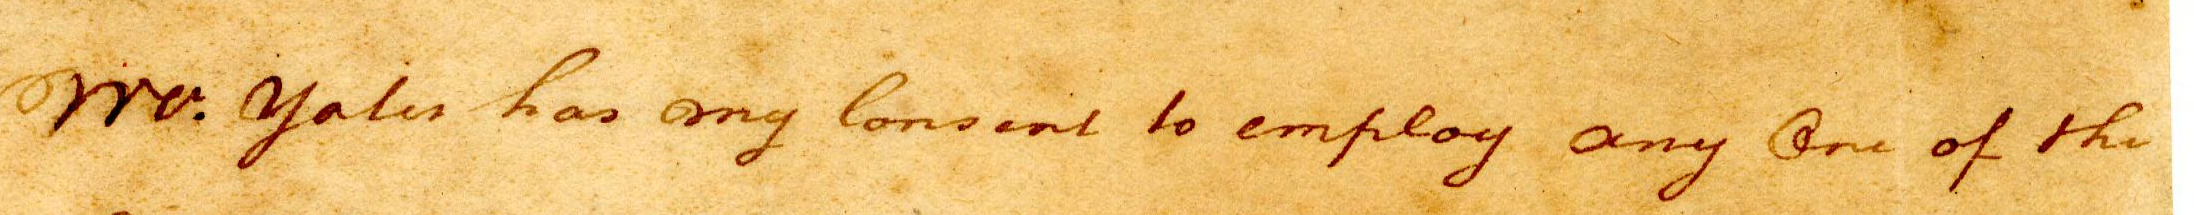M^r Yeates has my Consent to employ any One of the
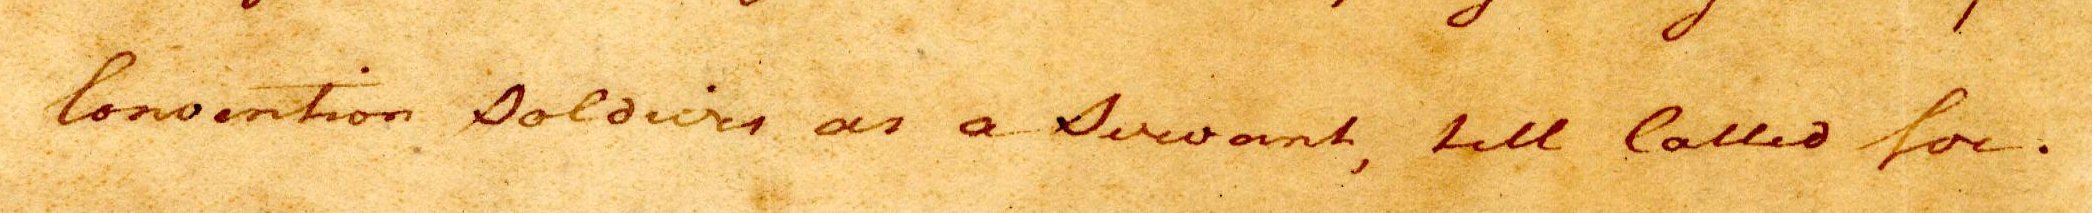Convention Soldiers as a Servant, till Called for.
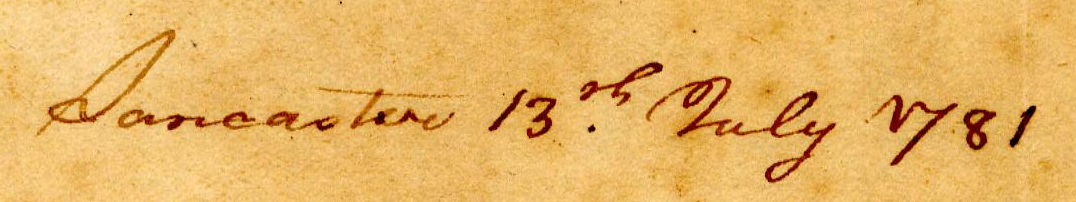Lancaster 13^th. July 1781
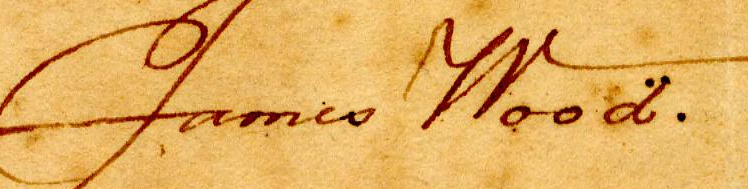James Wood.
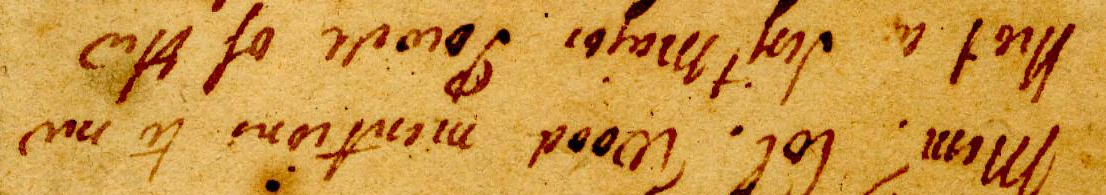Mem. Col. Wood mentions to me
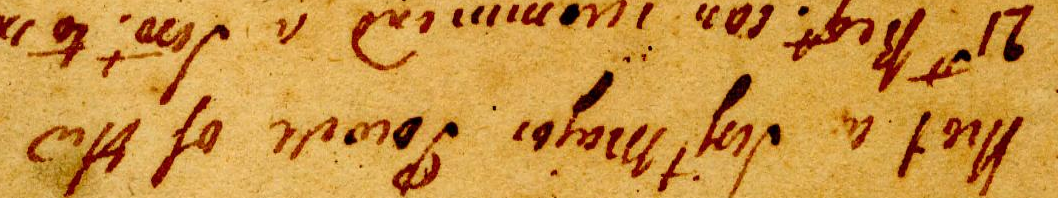that a Serj^t Major Powell of this
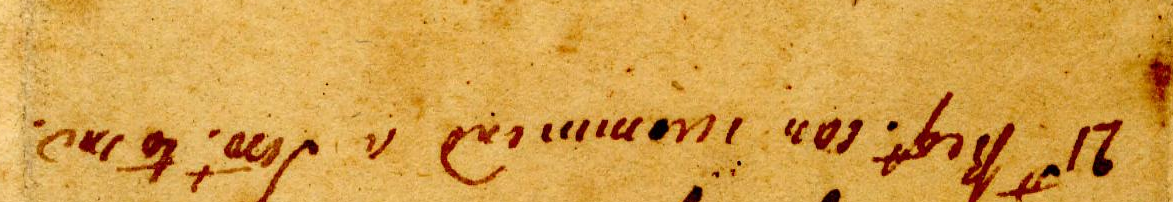21^t Reg^t. can recommend a Serv^t to me.
